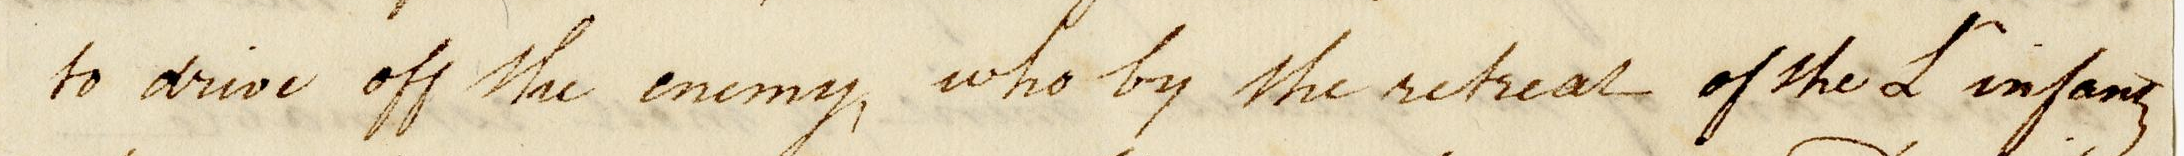to drive off the enemy, who by the retreat of the L^t infant
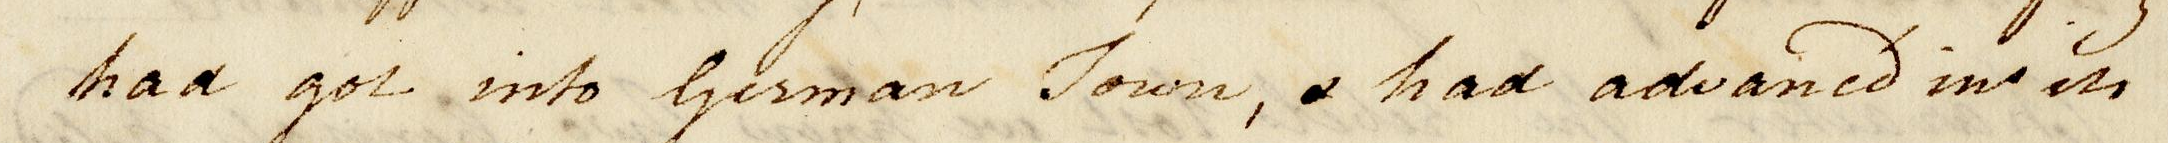had got into German Town, & had advanc'd in its
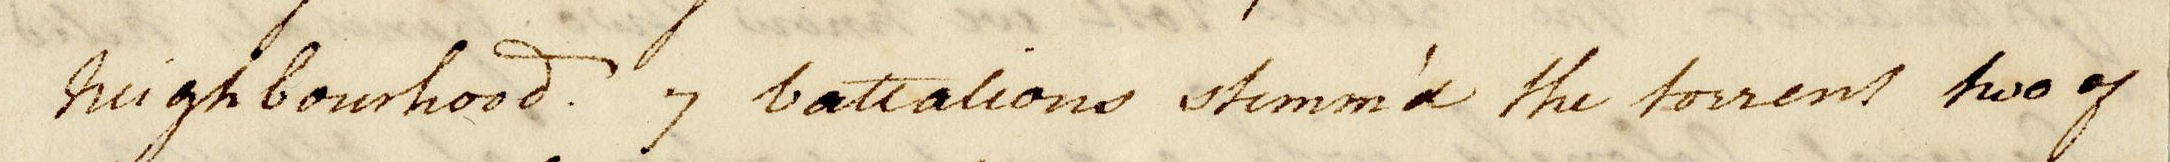neighbourhood. 7 battalions stemm'd the torrent two of
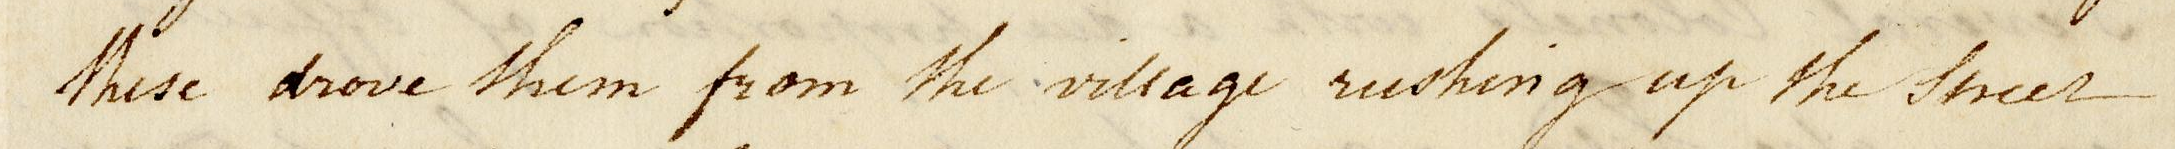these drove them from the village rushing up the street
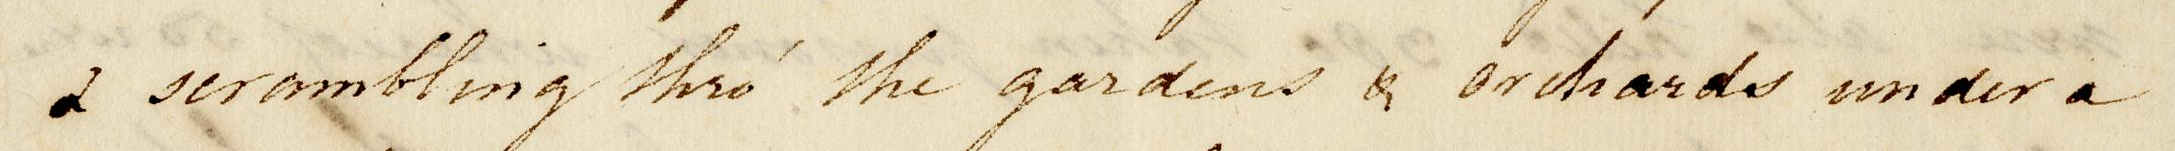& scrambling thro' the gardens & orchards under a
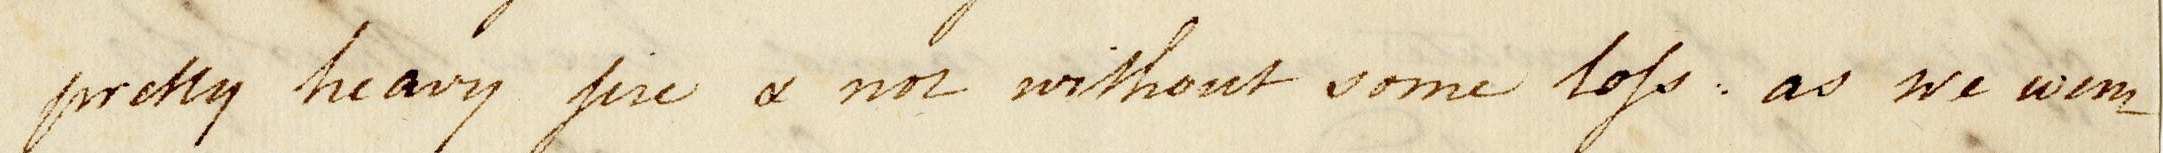pretty heavy fire & not without some loss: as we were
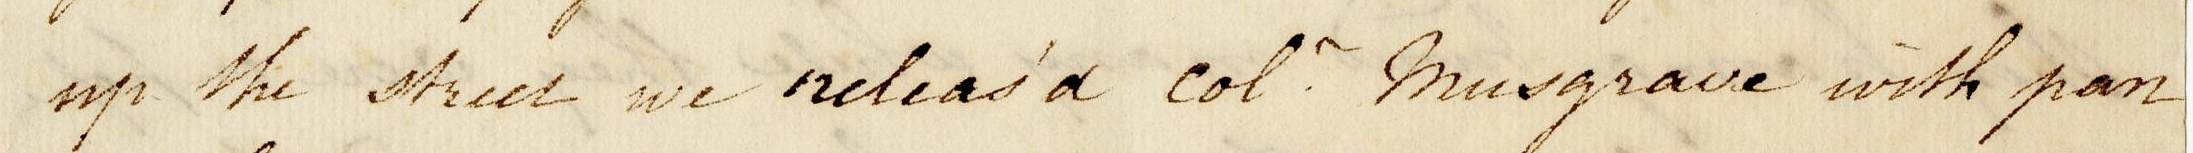up the street we releas'd Col^n. Musgrave with part
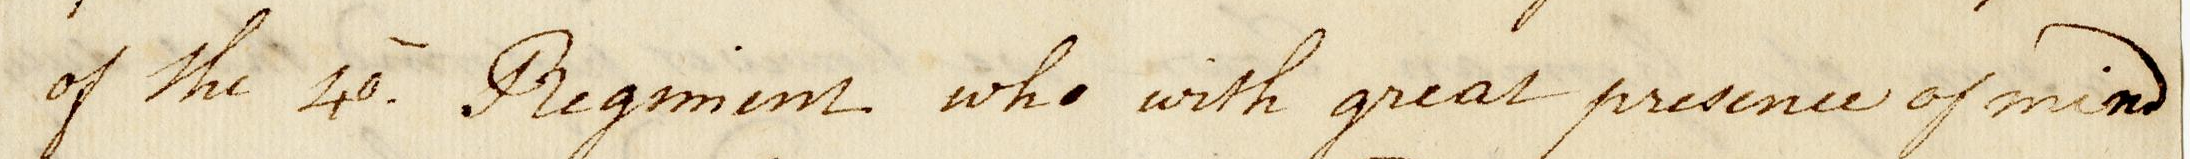of the 40. Regiment who with great presence of mind
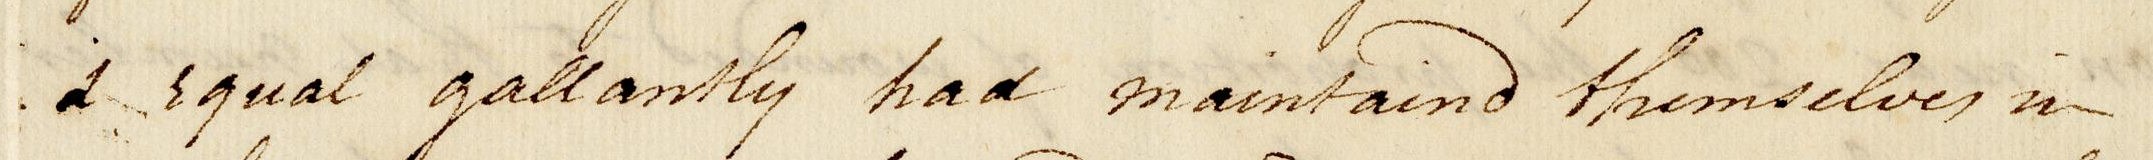& Equal gallantly had maintaind themselves in
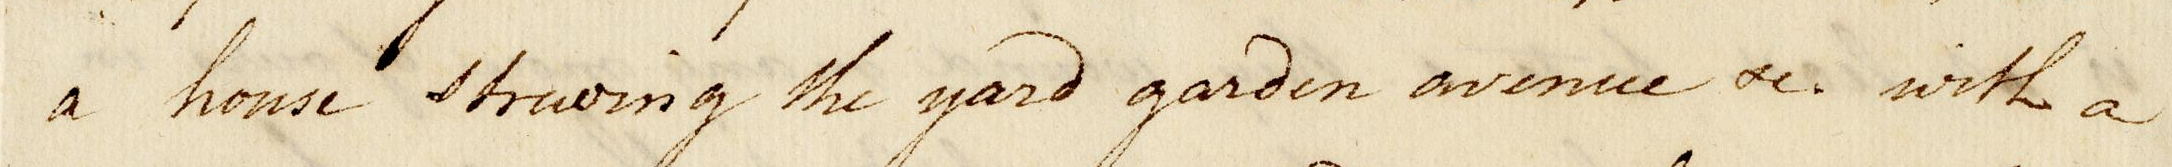a house strewing the yard garden avenue &c. with a
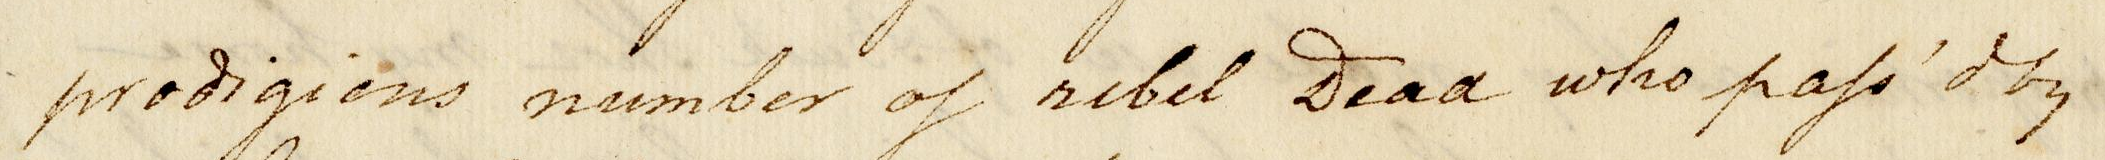prodigious number of rebel Dead who pass'd by
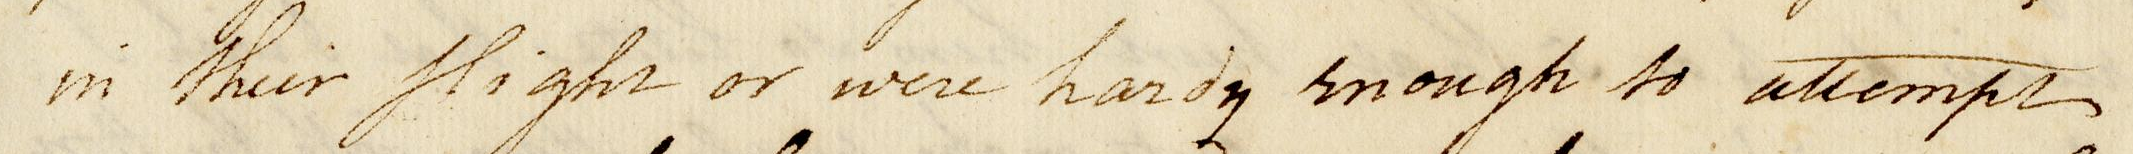in their flight or were hardy Enough to attempt
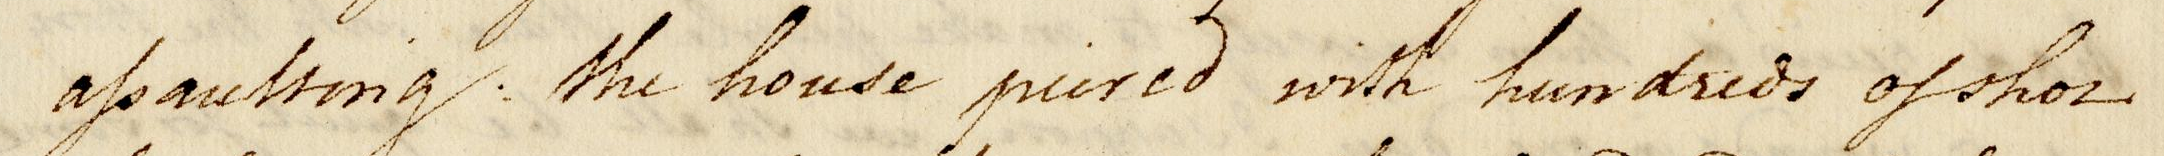assautting: the house piercd with hundreds of shot
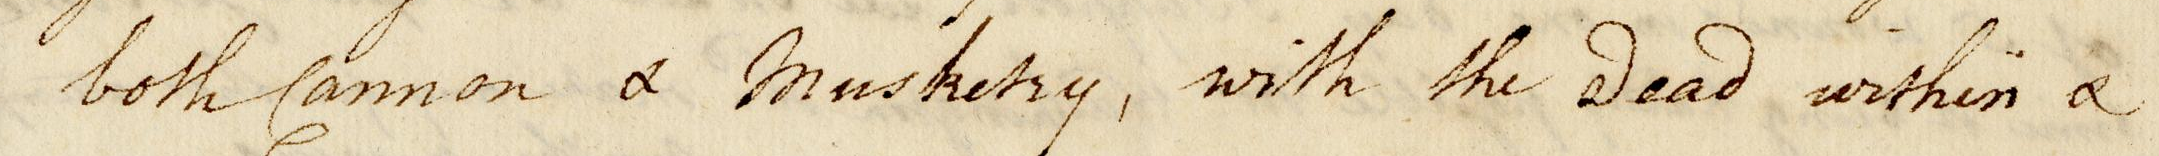both Cannon & musketry, with the dead within a
